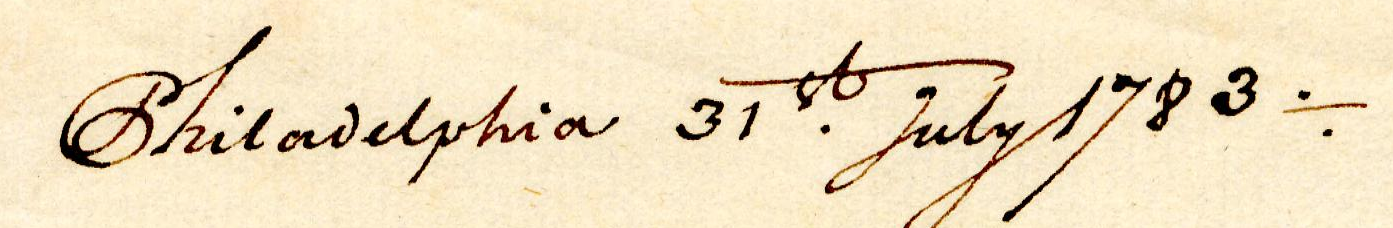Philadelphia 31^st. July 1783 ./.
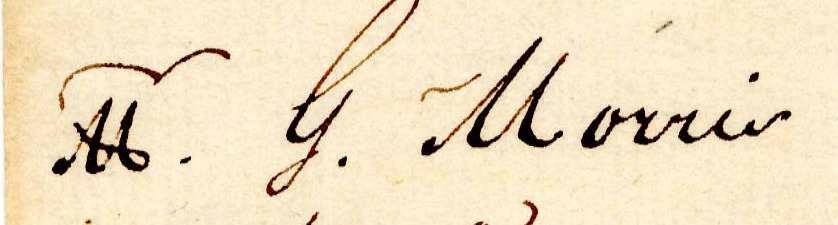M^r. G. Morris
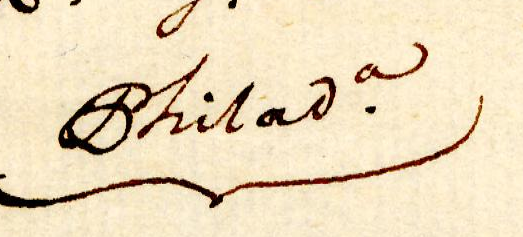Philad^a.
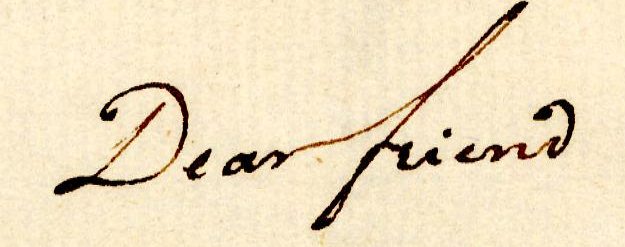Dear friend
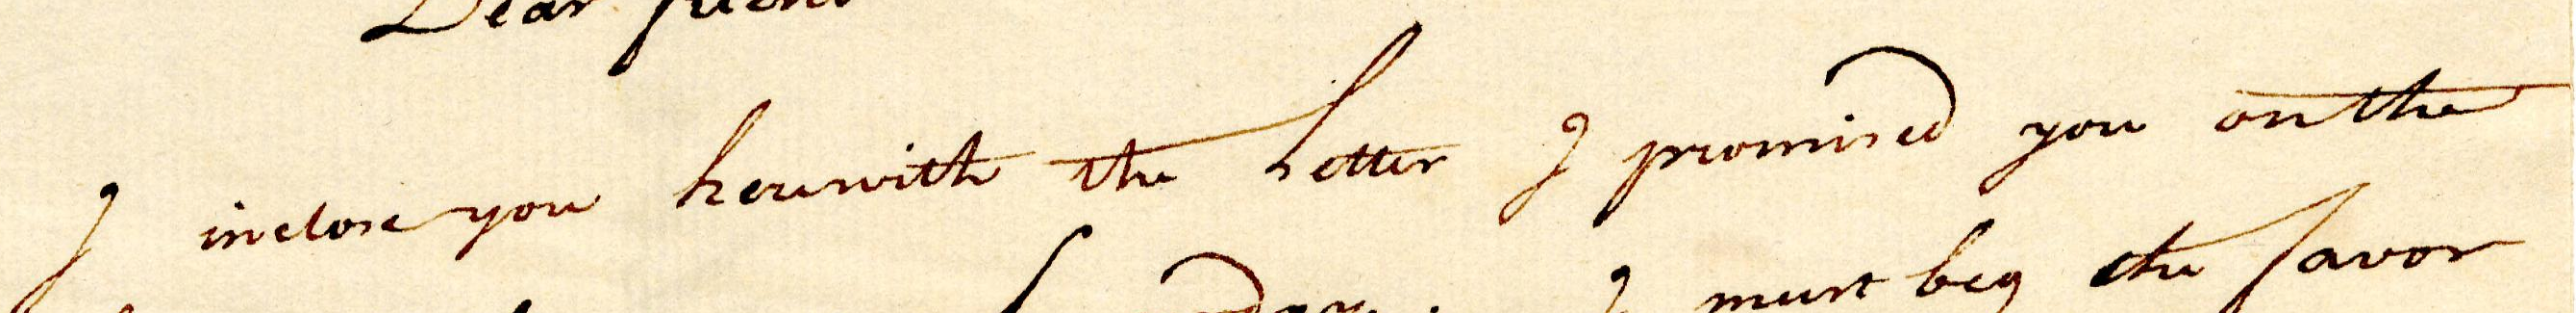I inclose you herewith the Letter I promised you on the
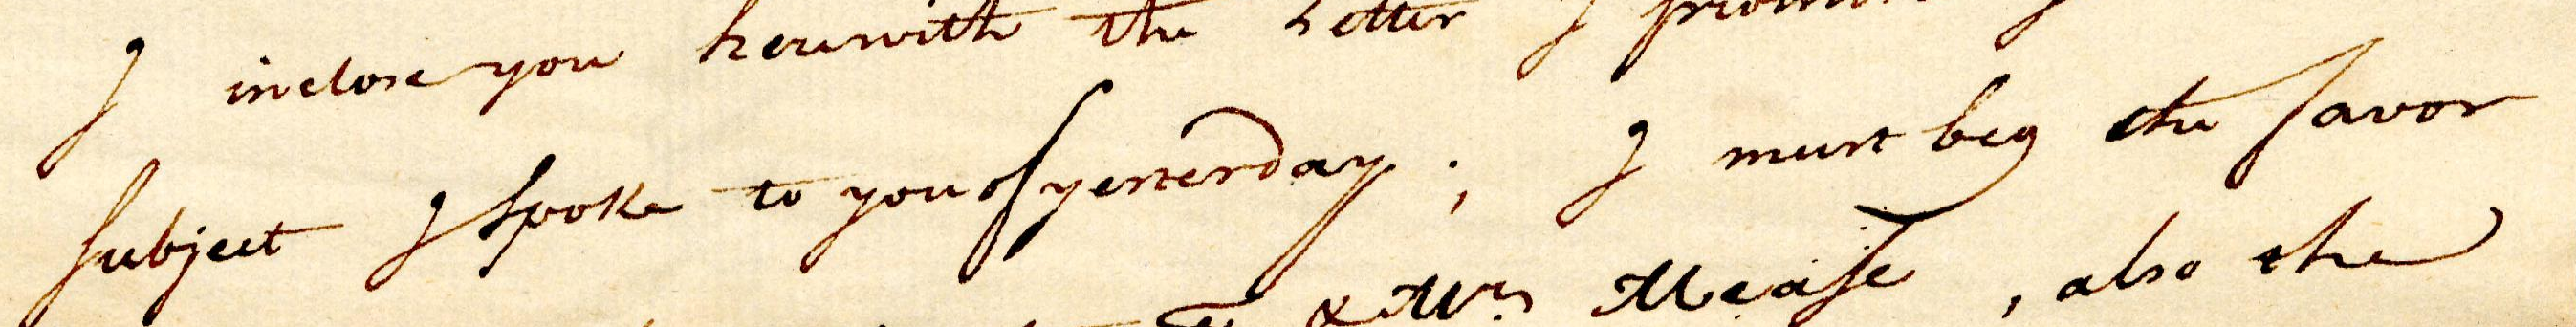subject I spoke to you of yesterday; I must beg the favor
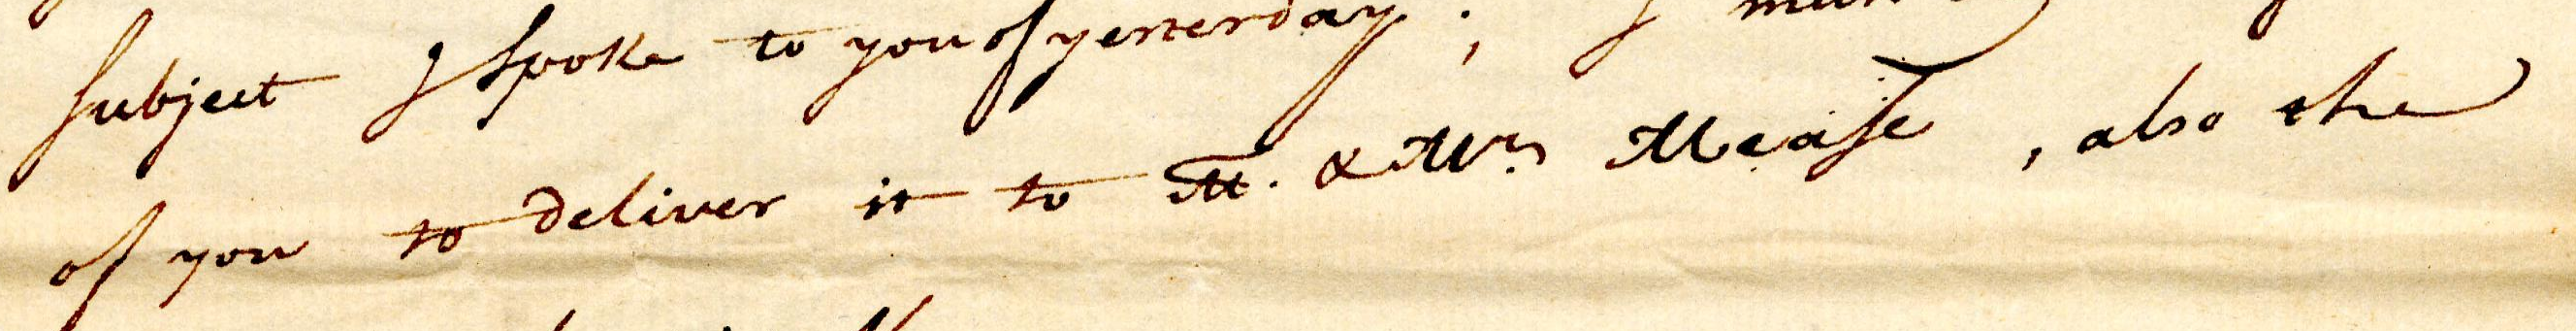of you to deliver it to M^r. & M&rs. Mease, also the
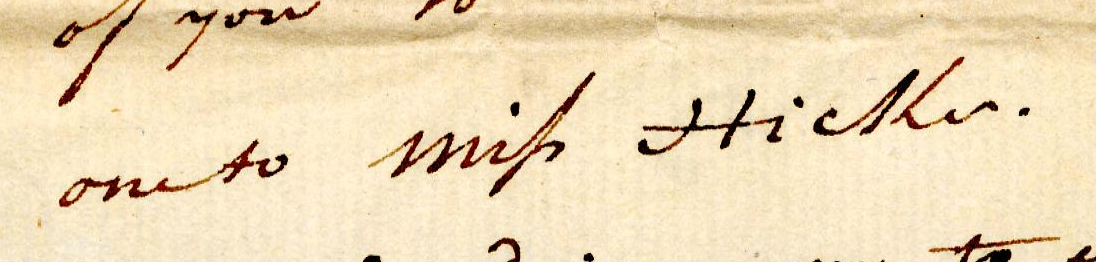one to Miss Hicks.
